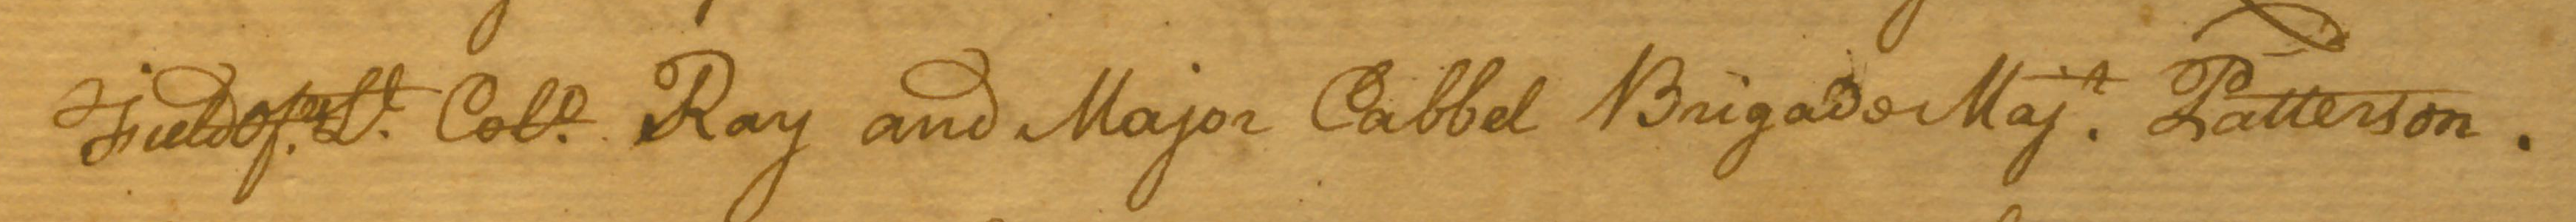Field Of^rs. L^t. Col^o. Ray and Major Cabbel Brigade Maj^r. Patterson
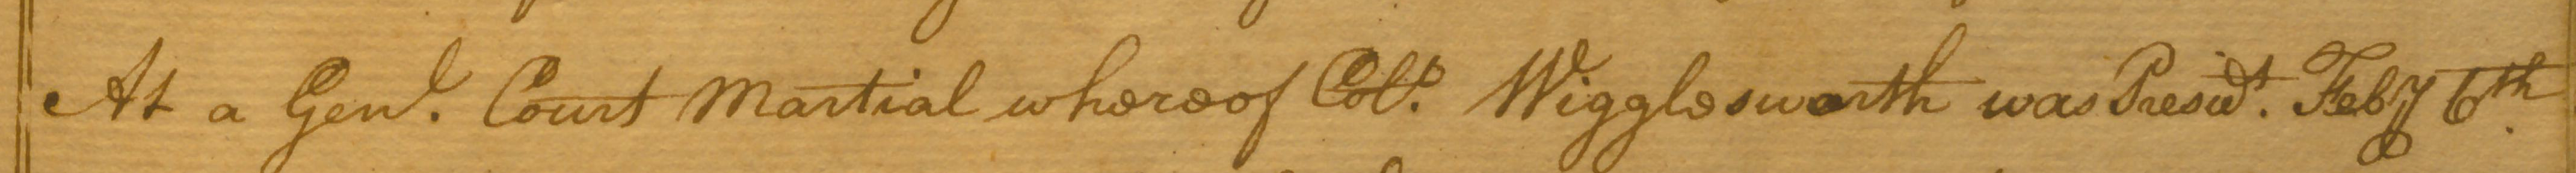At a Gen^l. Court Martial whereof Col^o. Wigglesworth was Presid^t. Feb^y 6^th
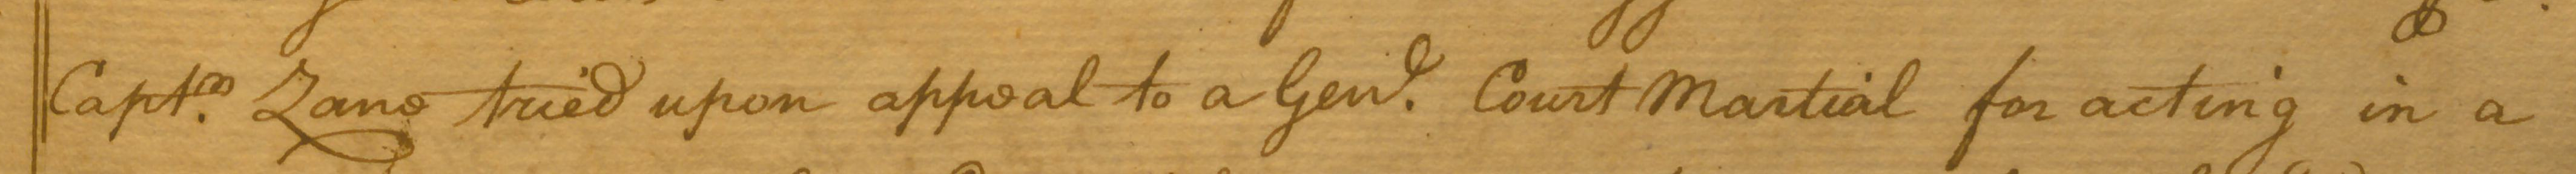Capt^n. Zane tried upon appeal to Gen^l. Court Martial for acting in a
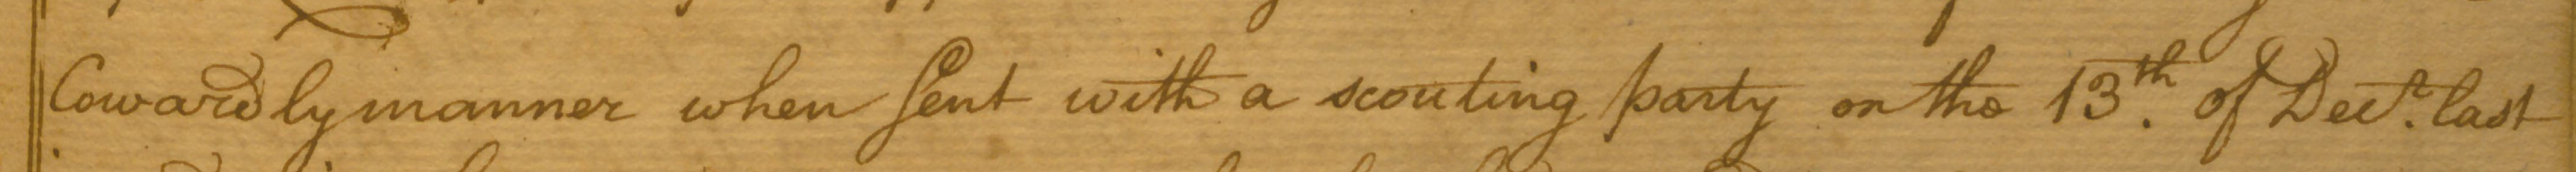Cowardly manner when sent with a scouting party on the 13^th. of Dec^r. last
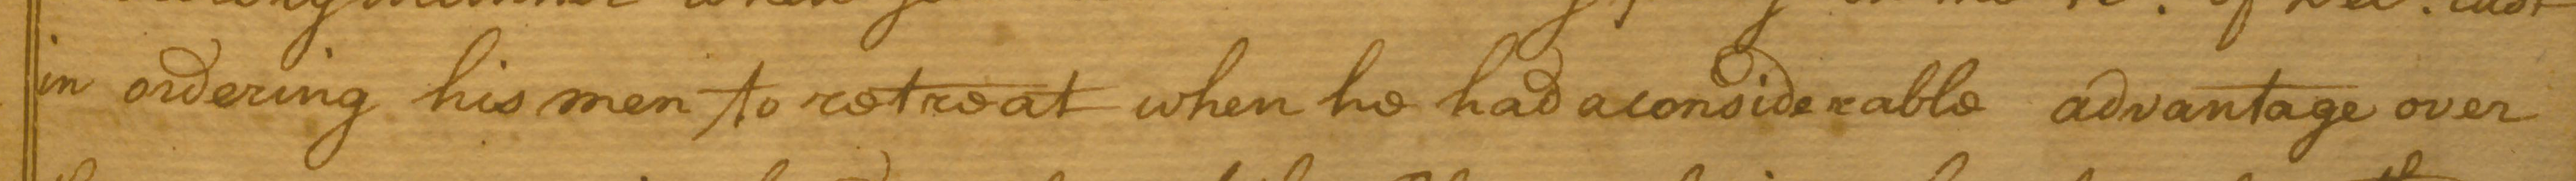in ordering his men to retreat when he had a considerable advantage over
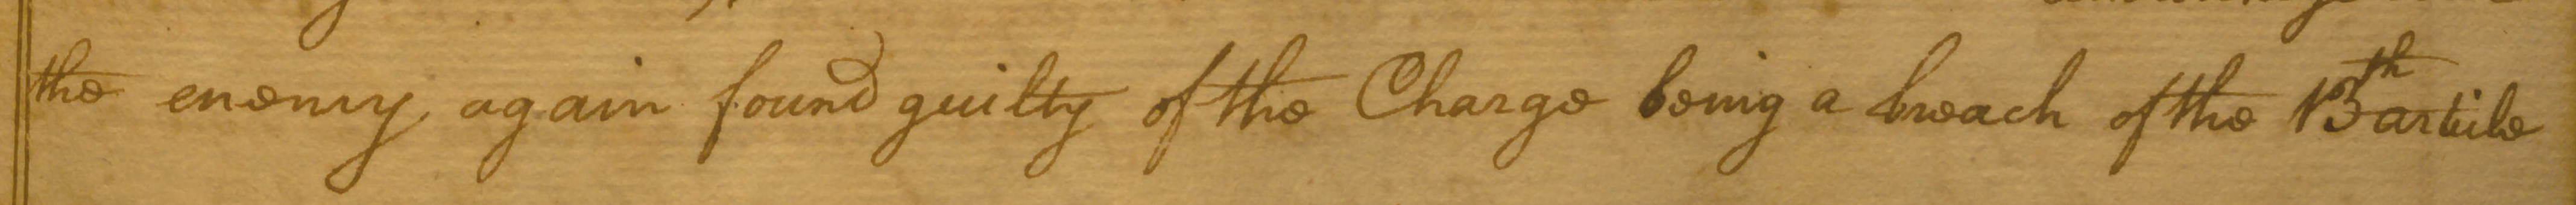the enemy again found guilty of the Charge being a breach of the 13^th article
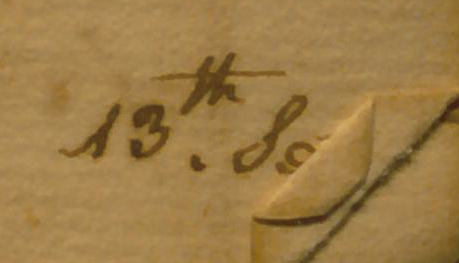13^th. Se
